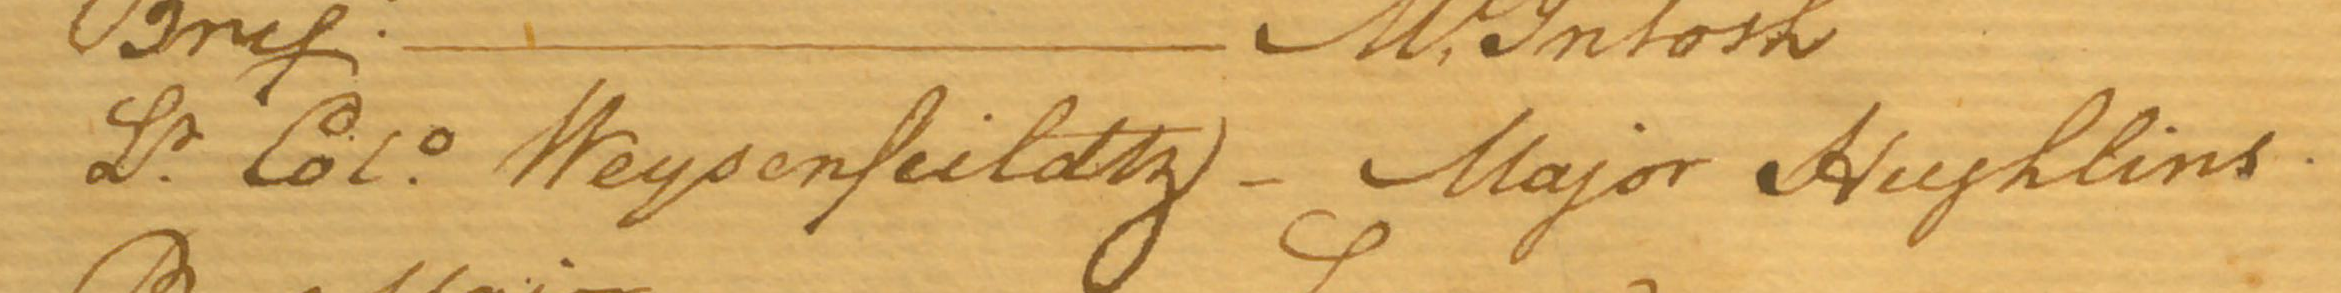L^t. Col^o. Weysenfeildtz- Major Hughlins
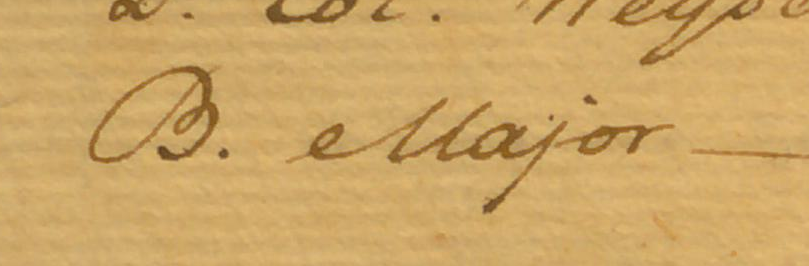B. Major-
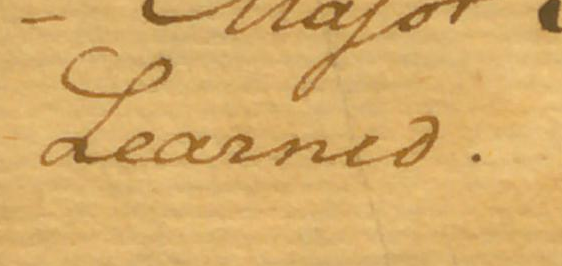Learned.
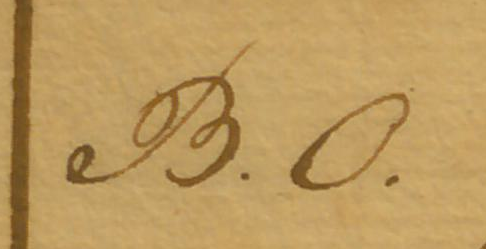B. O.
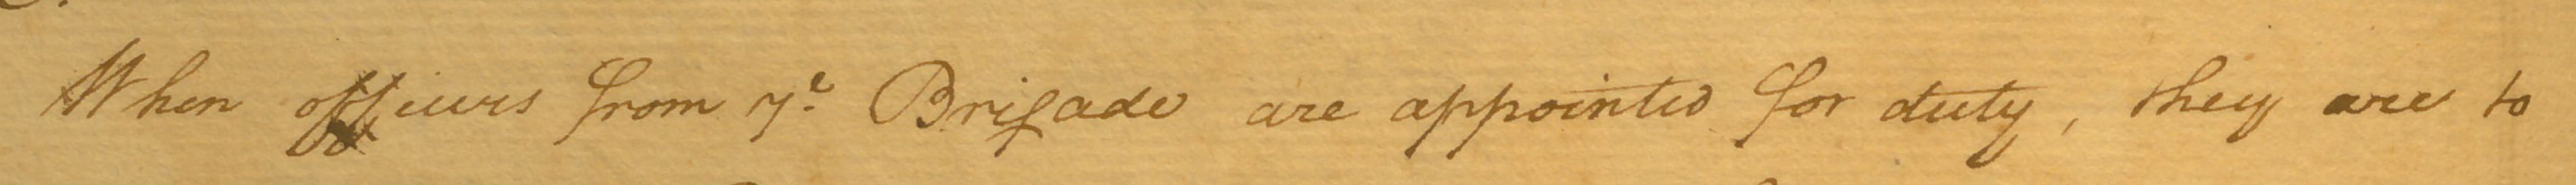When officers from y^e. Brigade are appointed for duty, they are to
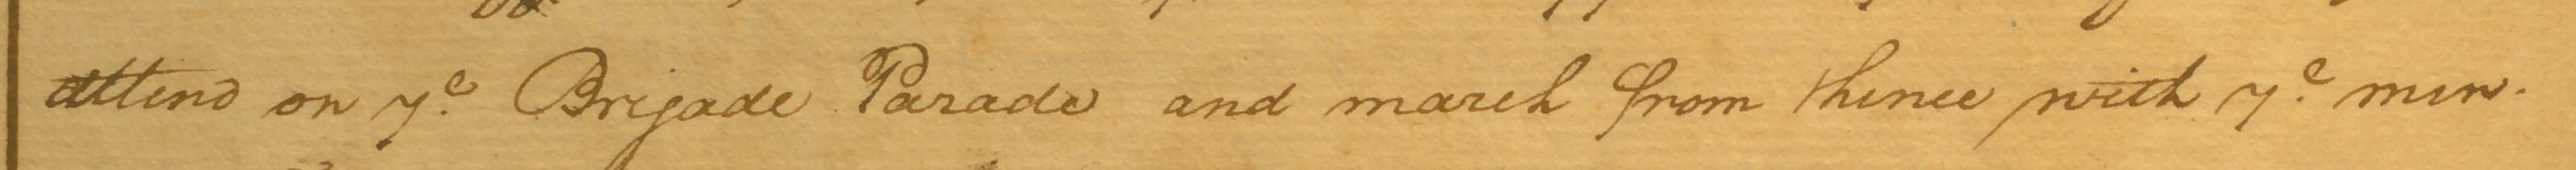attend on y^e. Brigade Parade and march from thence with y^e. men.
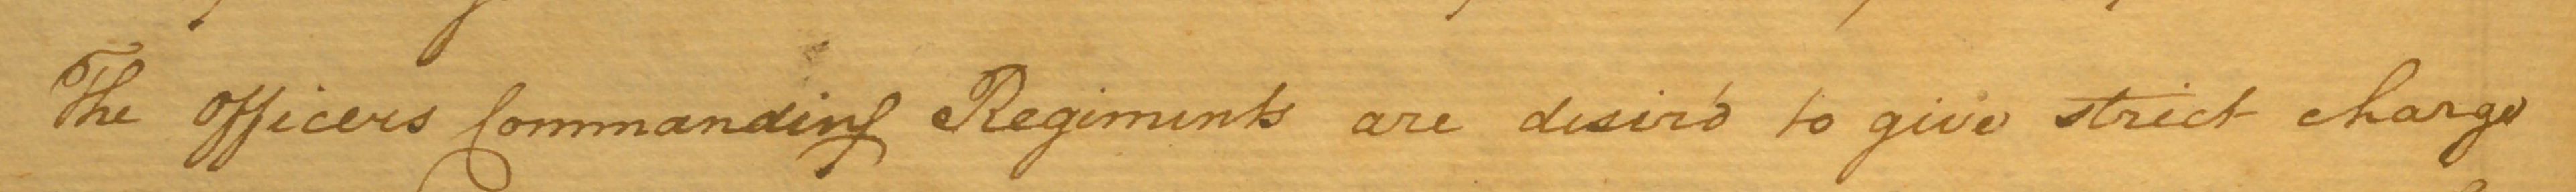The officers Commanding Regiments are desir'd to give strict charge
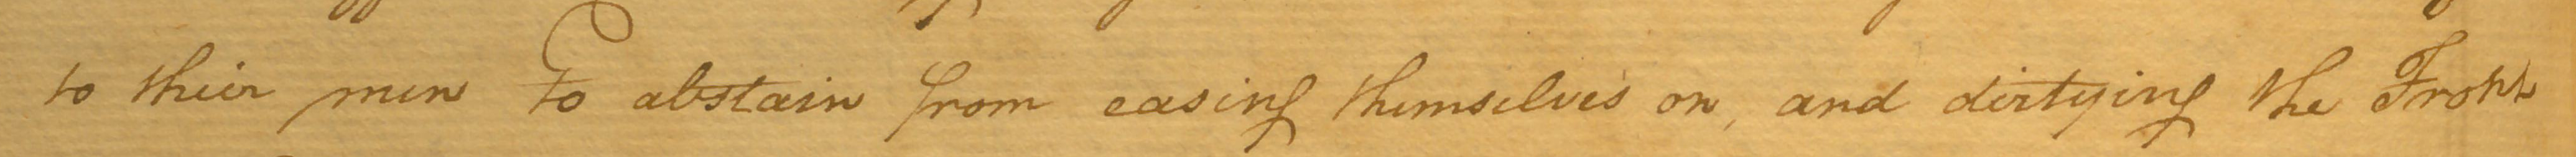to their men to abstain from easing themselves on, and dirtying the Front
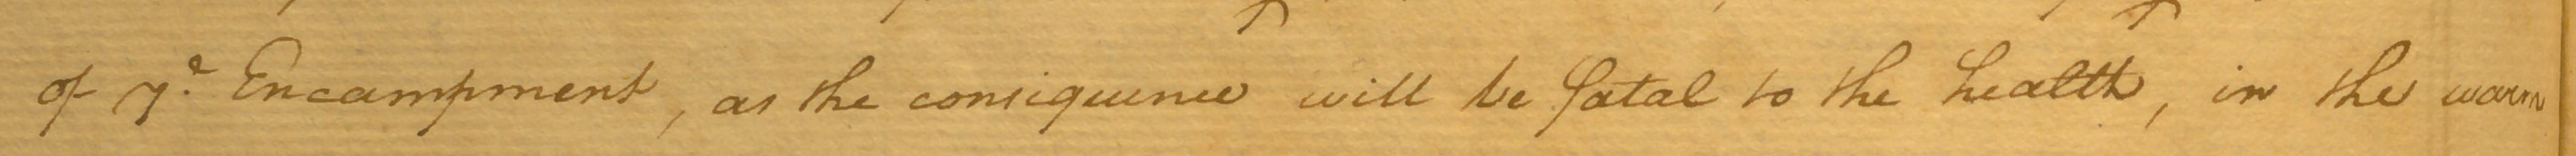of y^e. Encampment, as the consiquence will be fatal to the health, in the warm
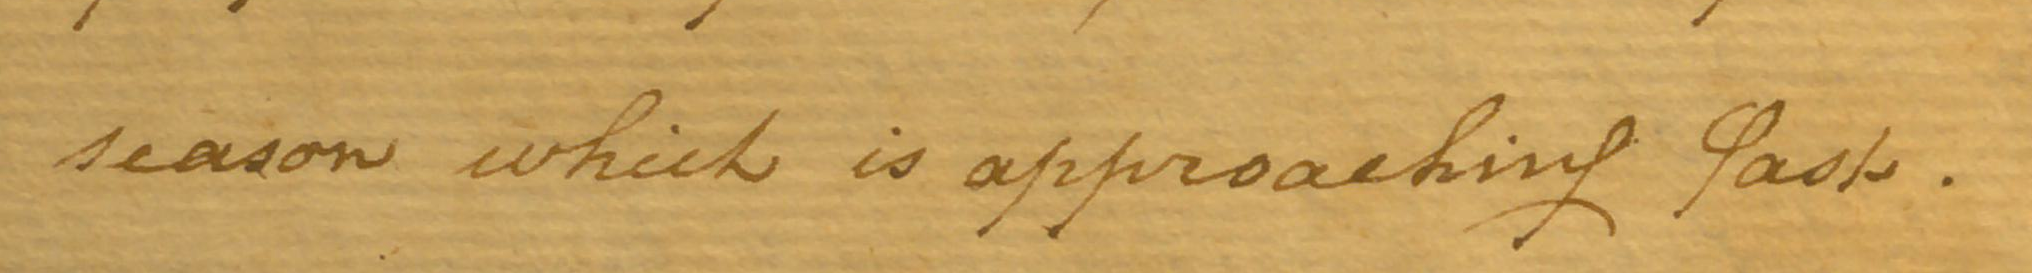season which is approaching fast.
